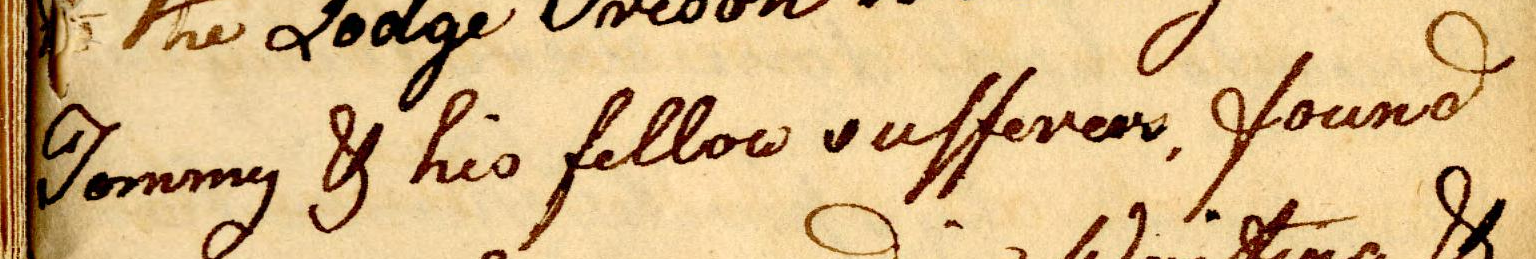Tommy & his fellow sufferers, found
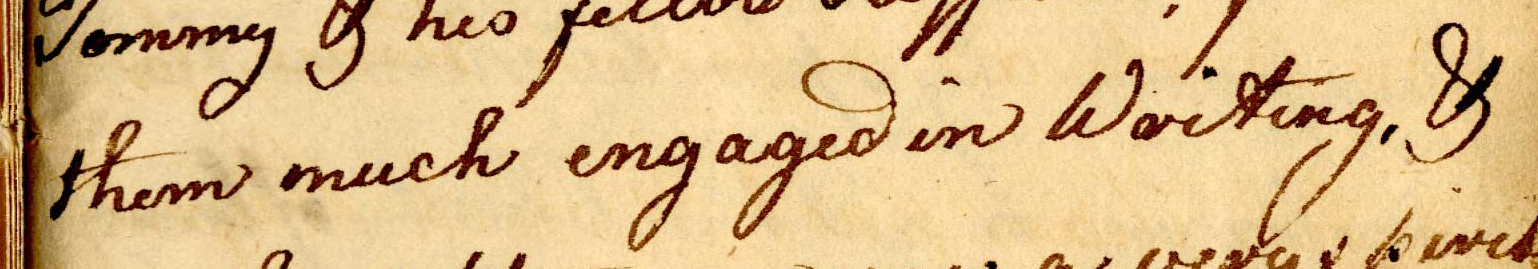them much engaged in Writing, &
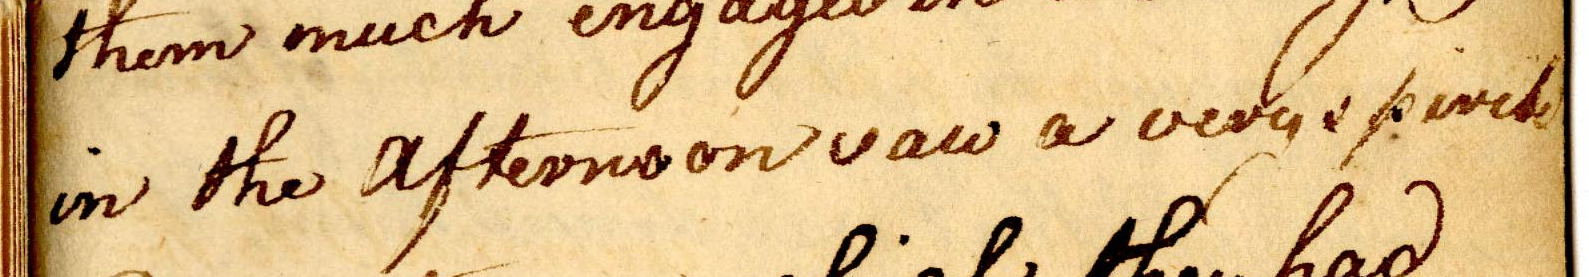in the Afternoon saw a very spiritd
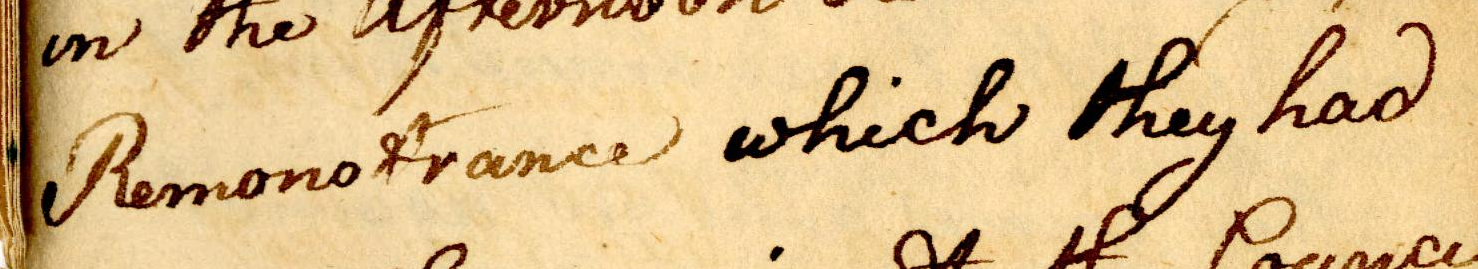Remonstrance which they had
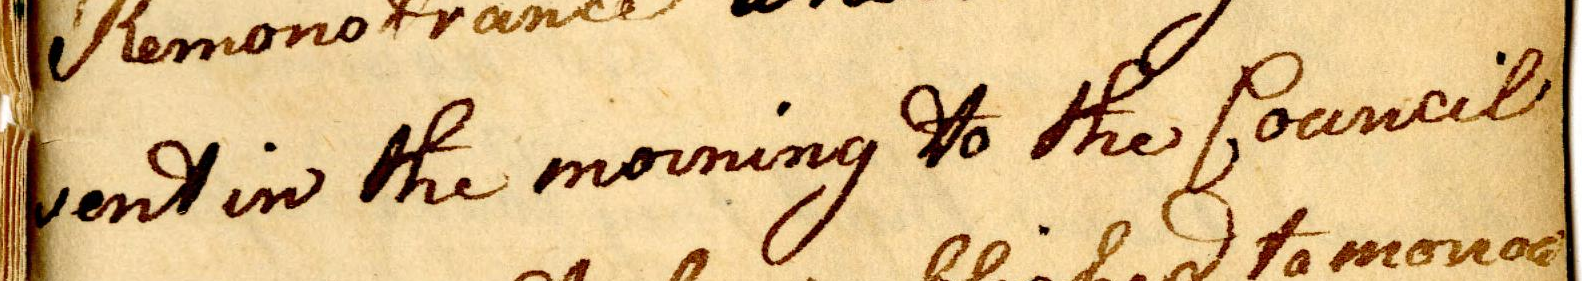sent in the morning to the Council
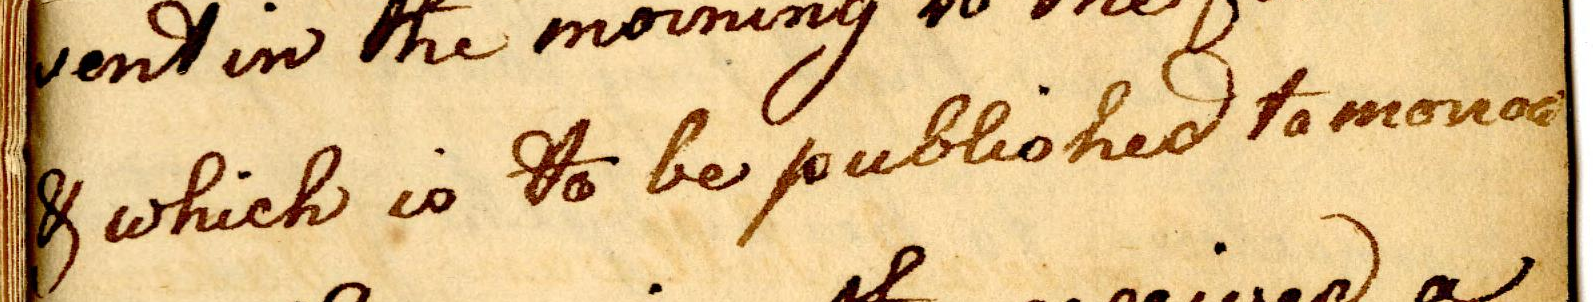& which is to be published to morrow
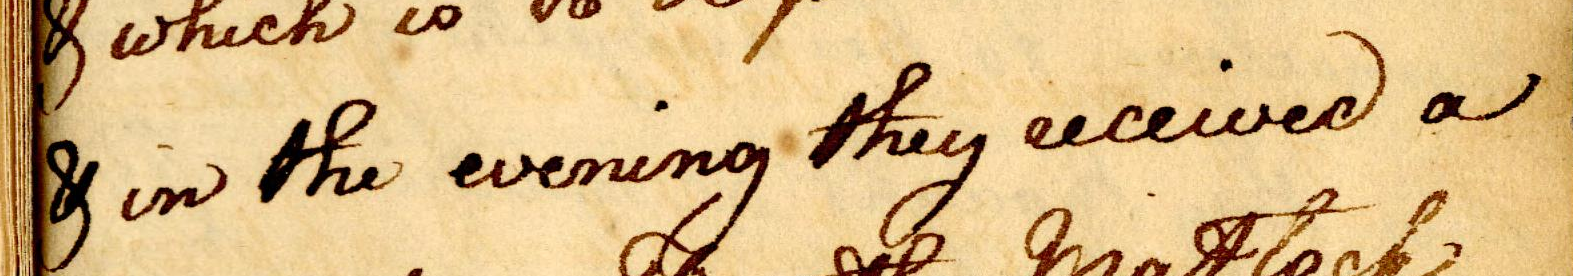& in the evening they received a
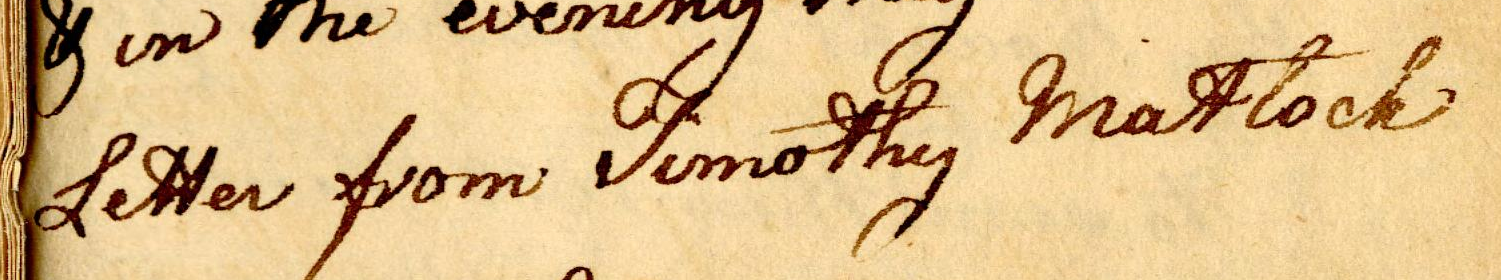Letter from Timothy Matlock
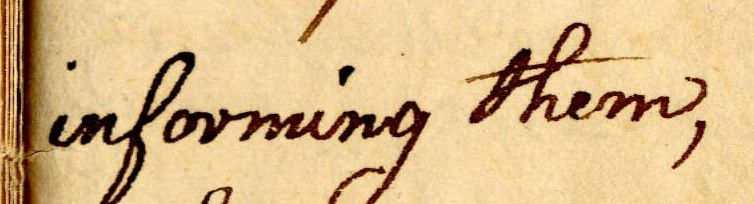informing them,
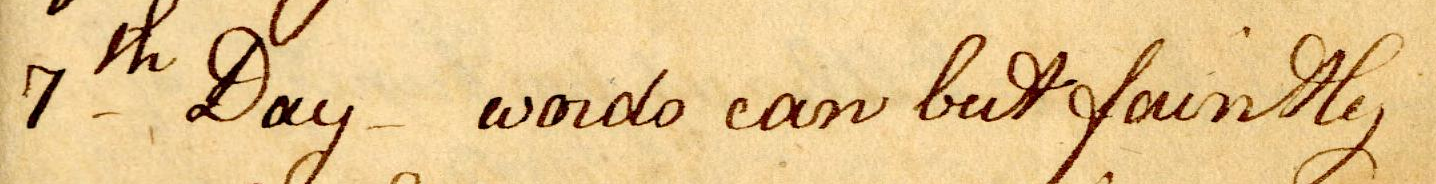7^th Day- words can but faintly
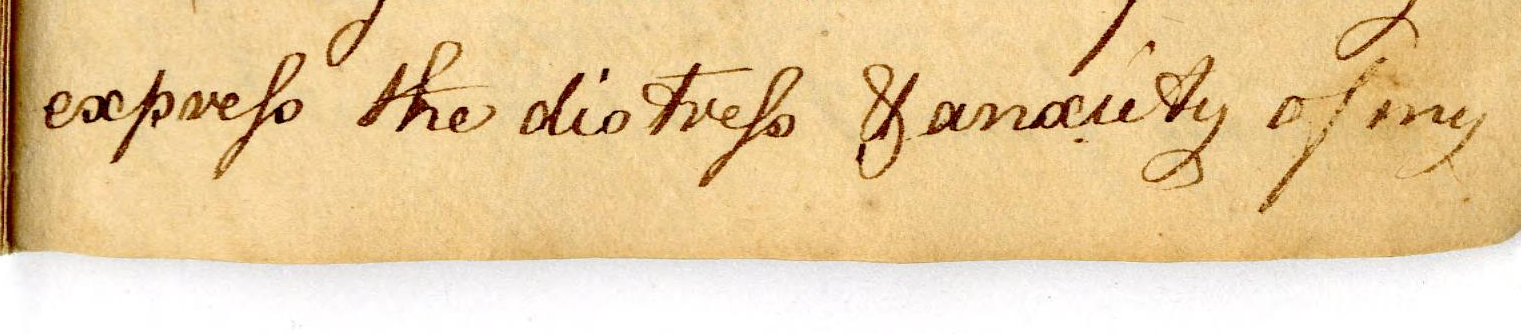express the distress & anxiety of my
